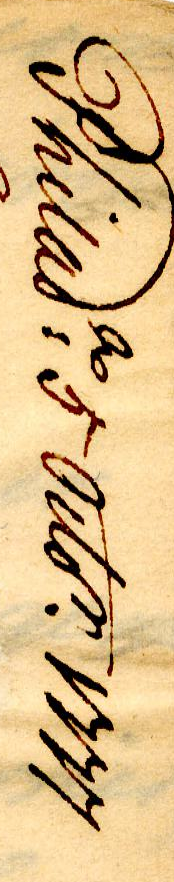Philad^a. 5 Octo^r. 1777
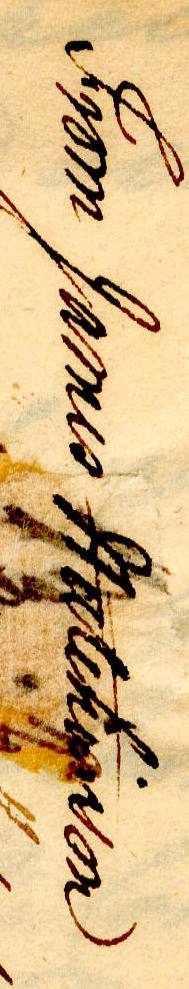From James Hutchinson
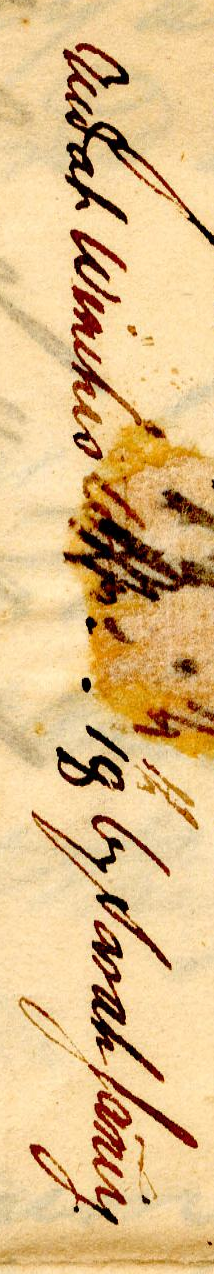recd at Winchester [__] 18^th by Sarah Janey
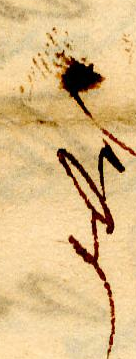For
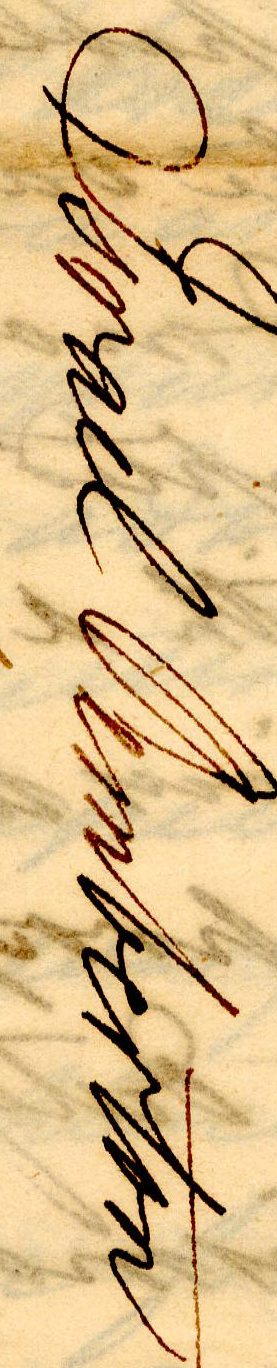Israel Pemberton
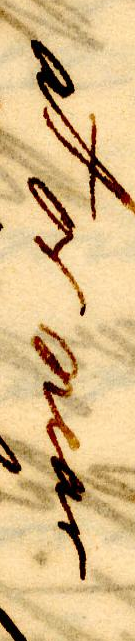at or near
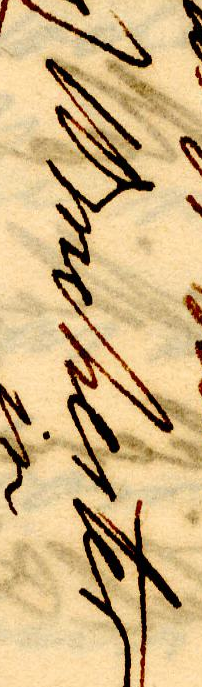Winchester
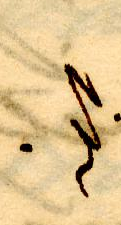in
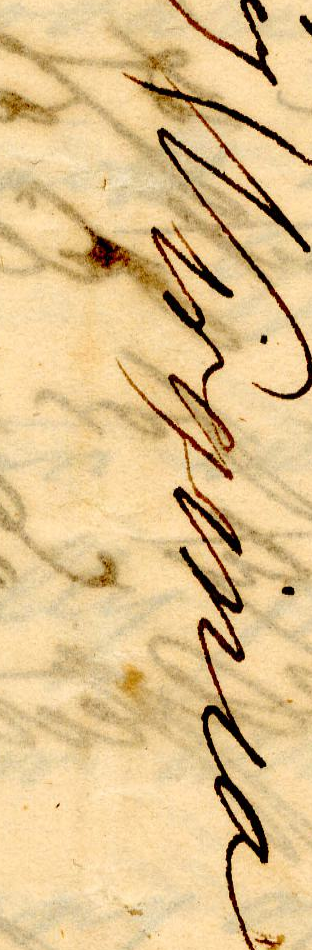Virginia
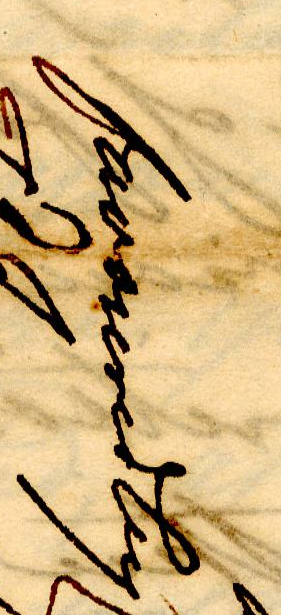favoured by
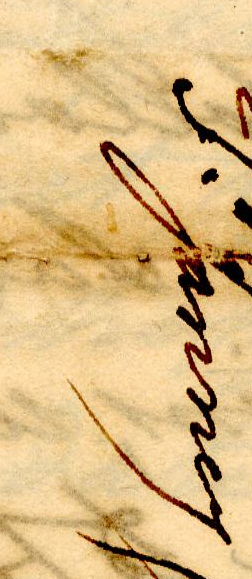F^d. Janney
